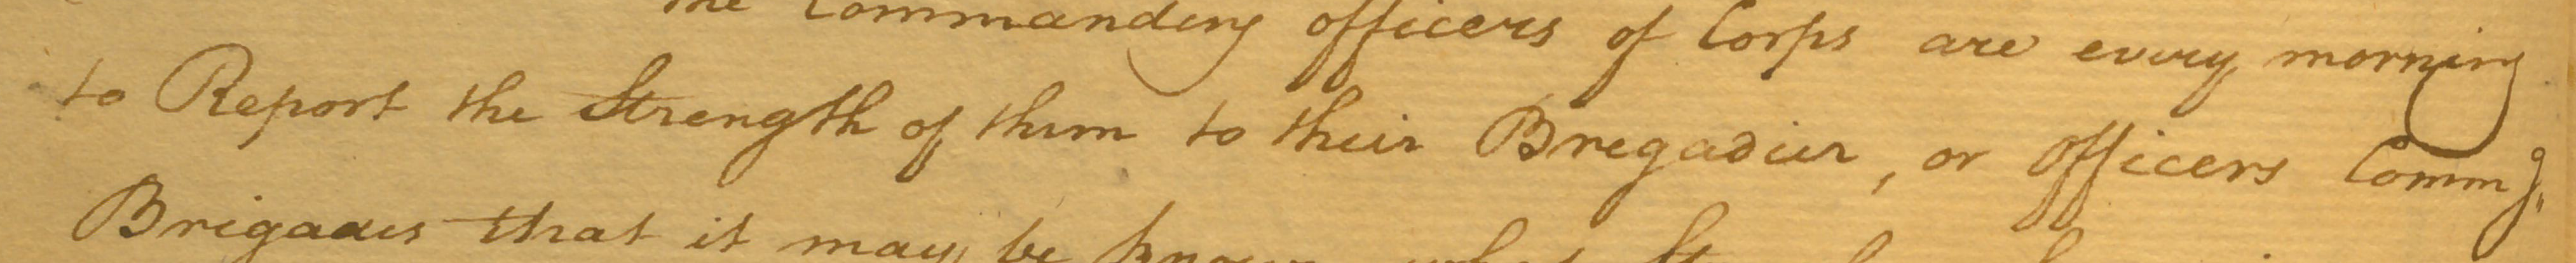to Report the Strength of them to their Brigadier, or Officers Comm^g.
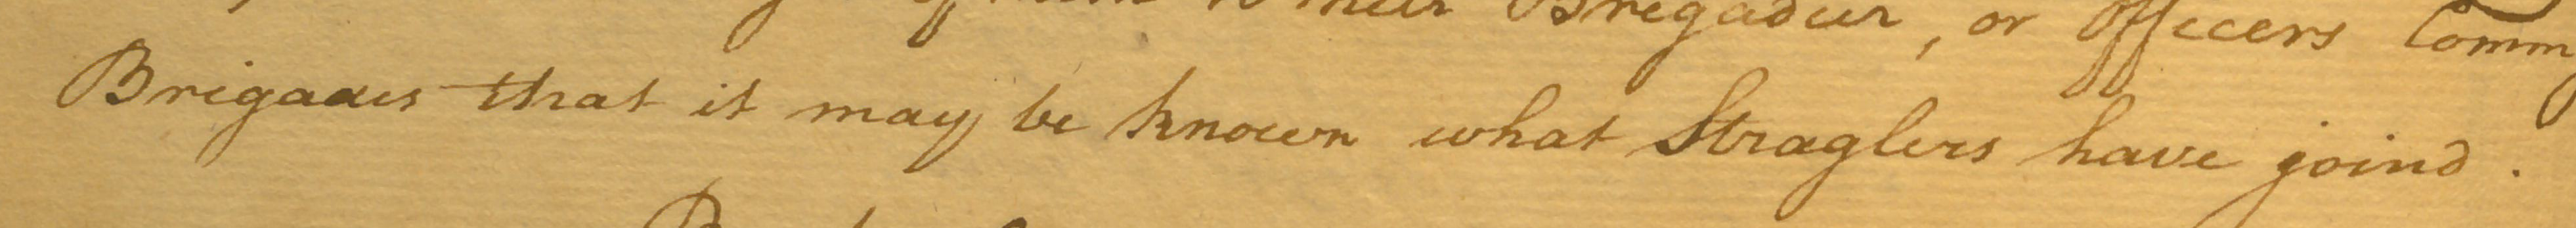Brigades that it may be known what Straglers have joind.
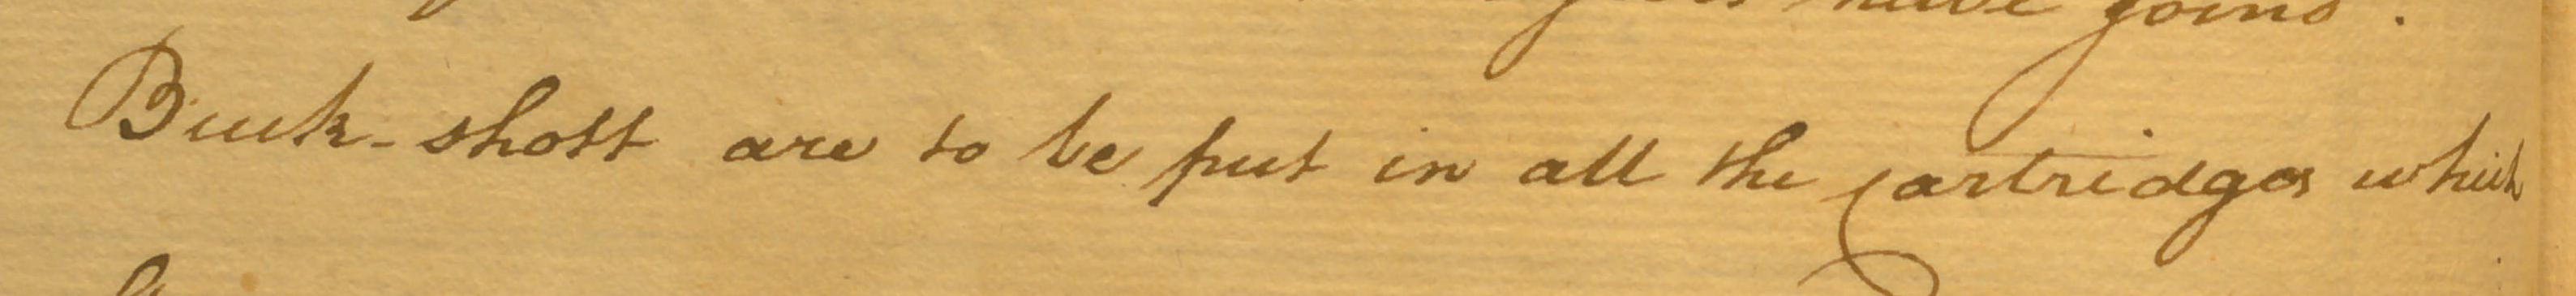Back-shott are to be put in all the Cartridges which
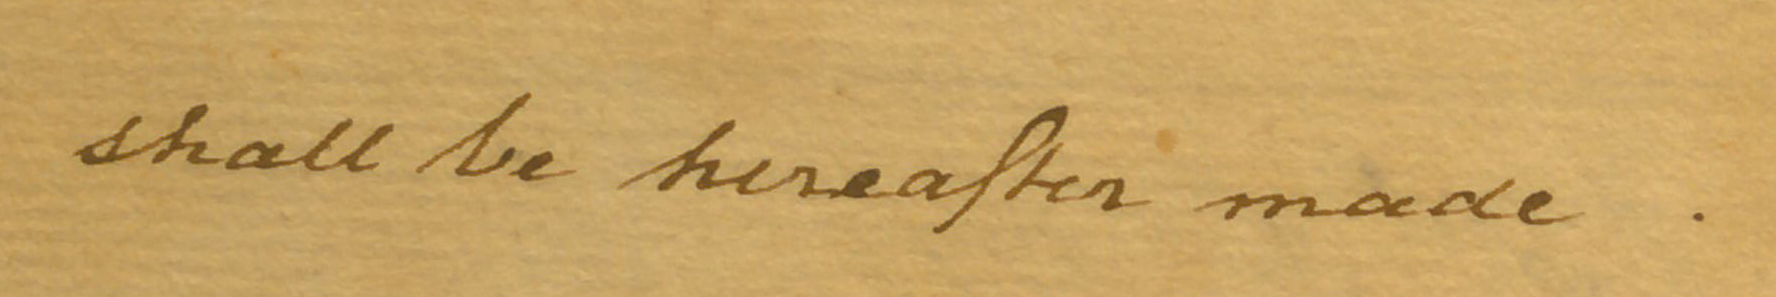shall be hereafter made.
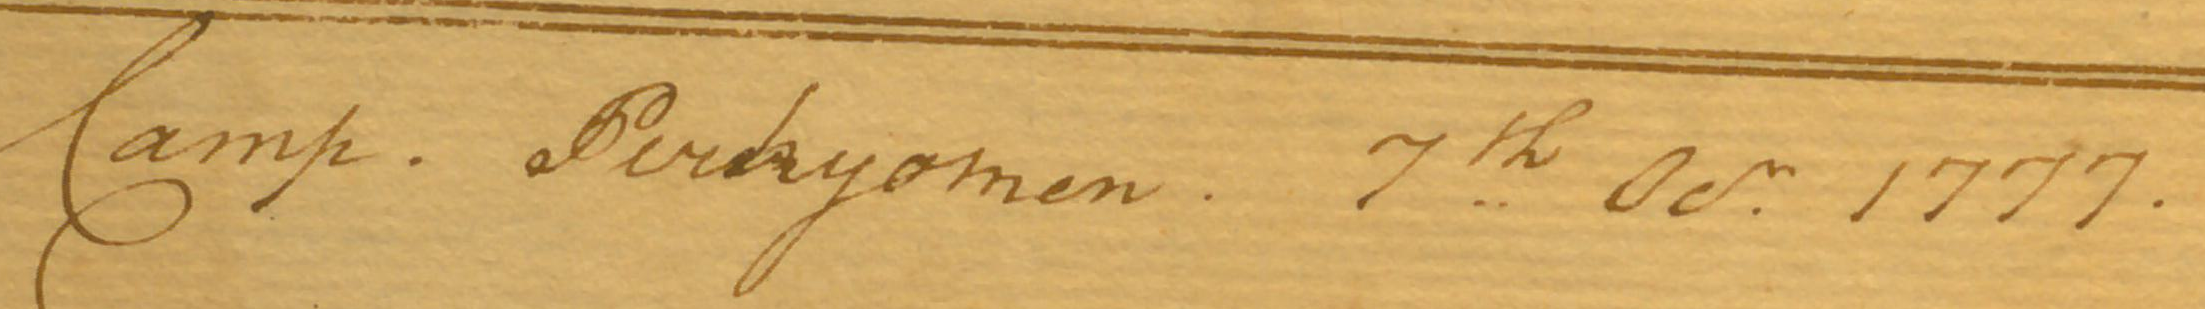Camp. Perkyomen. 7^th. Oc^r. 1777.
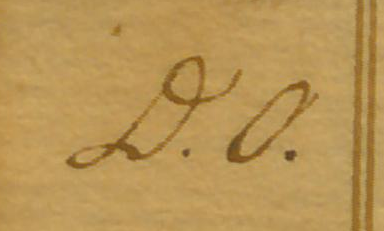D.O.
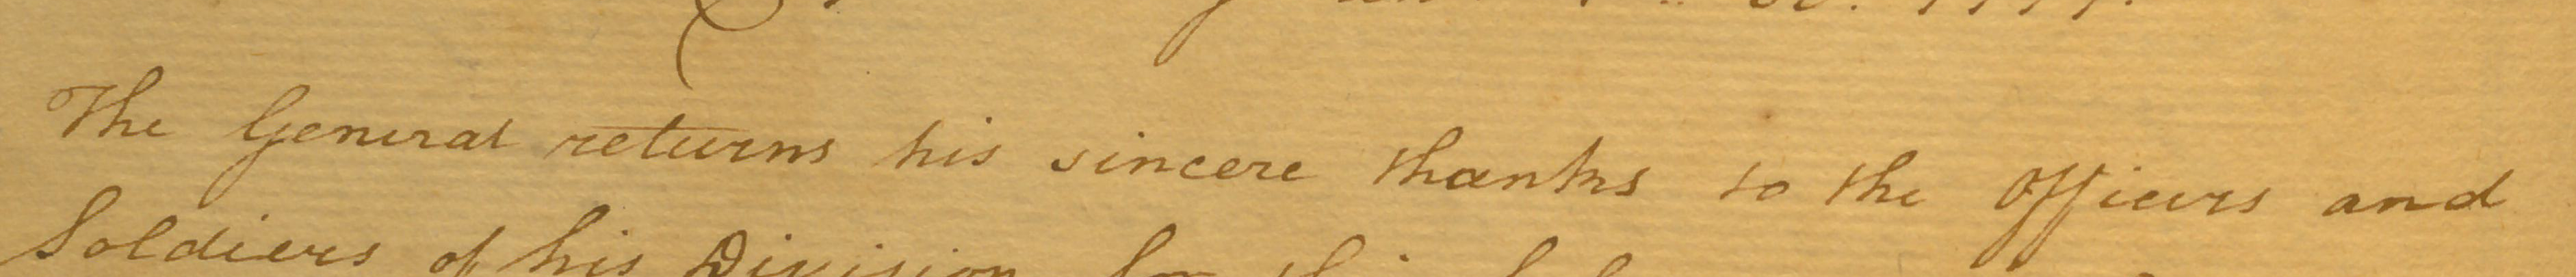The General returns his sincere thanks to the Officers and
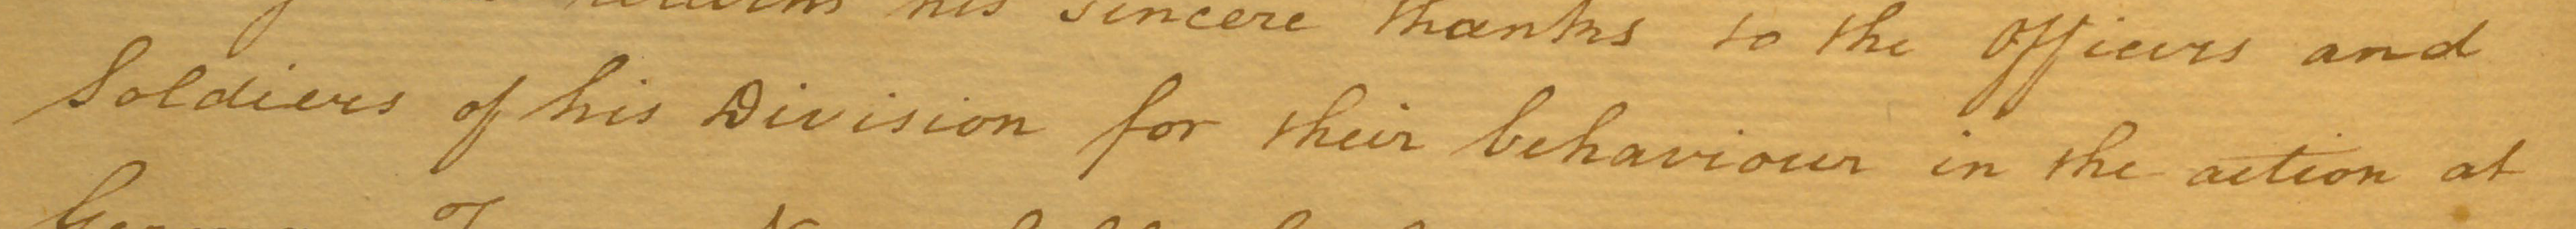Soldiers of his Division for their behavior in the action at
